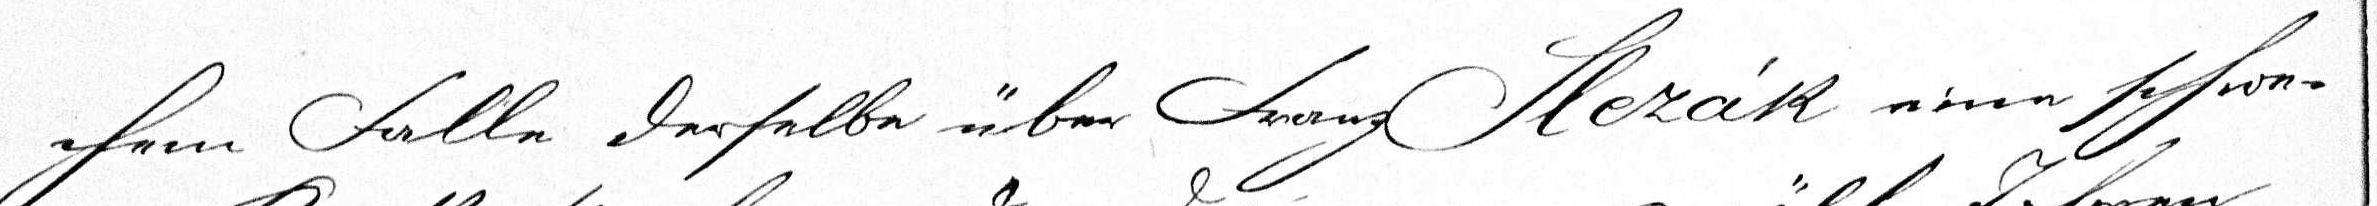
chem Falle derselbe über Franz Slezák eine schwe¬
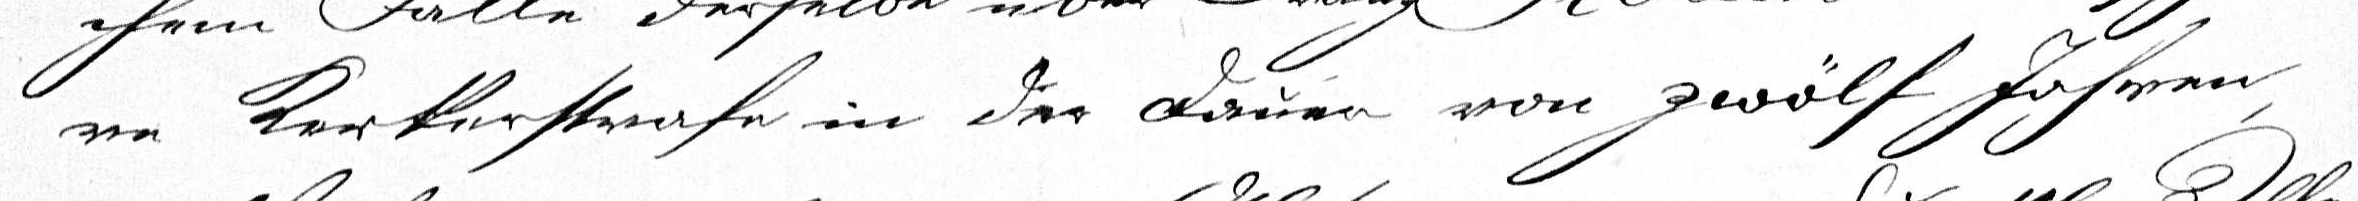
re Kerkerstrafe in der Dauer von zwölf Jahren,
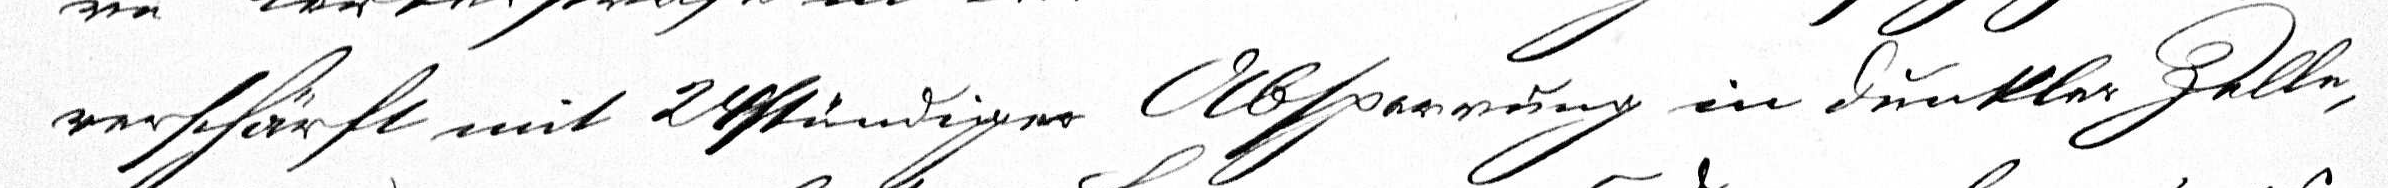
verschärft mit 24ständiger Absperrung in dunkler Zelle,
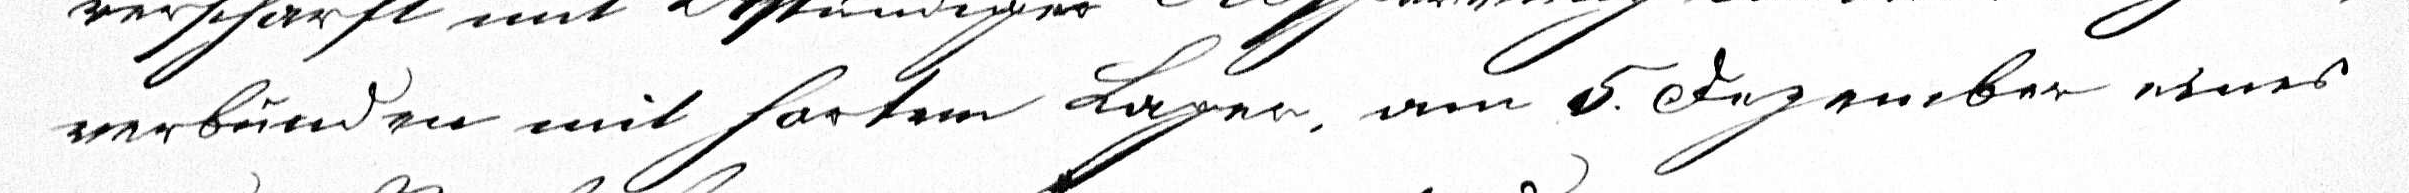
verbunden mit hartem lager, am 5. Dezember eines
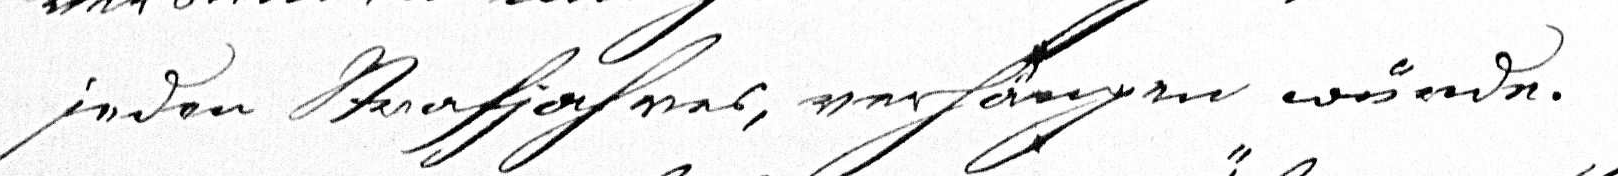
jeden Strafjahres, verhängen würde.
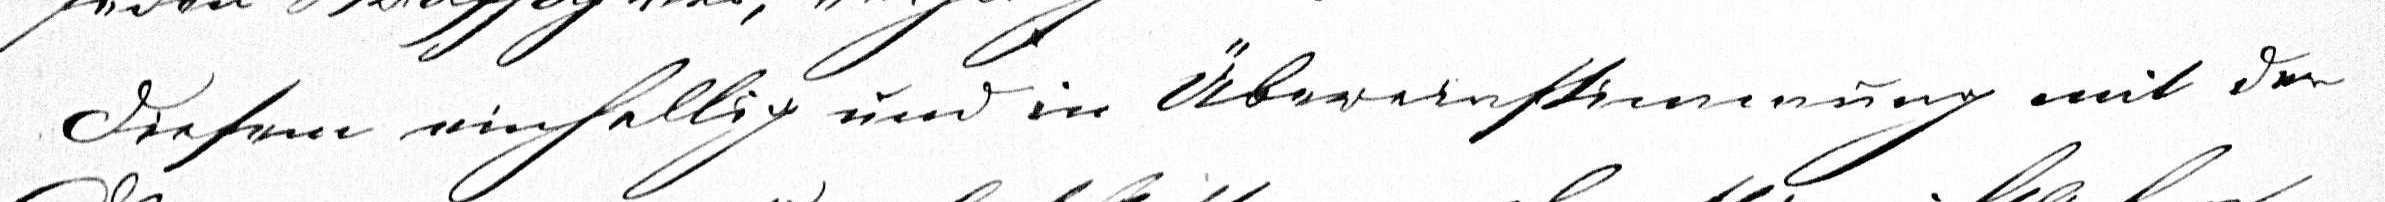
Diesem einhellig und in Übereinstimmung mit der
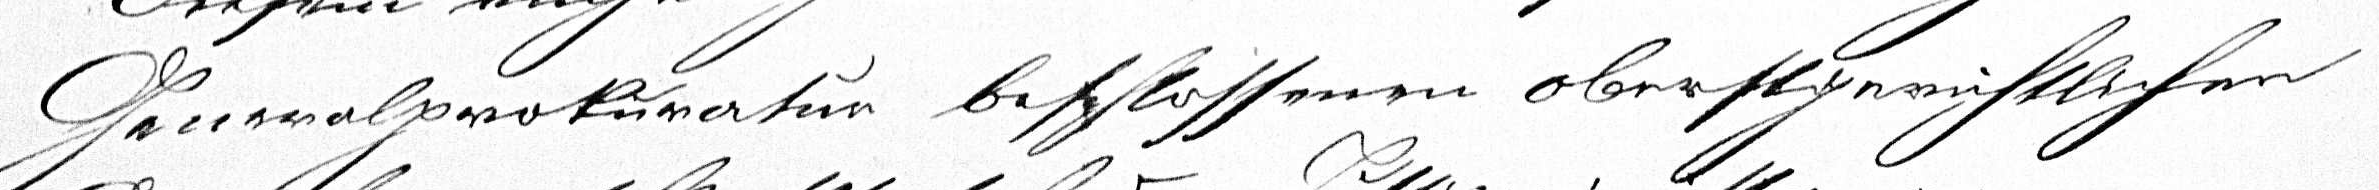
Generalprokuratur beschlossenen oberstgerichtlichen
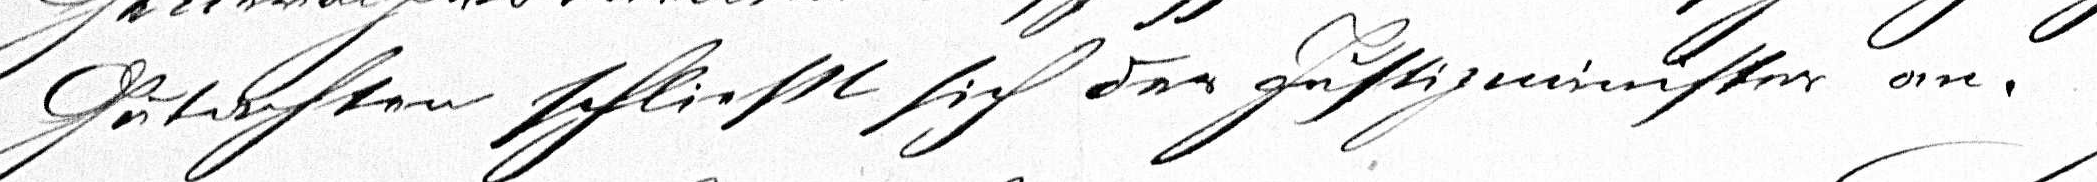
Gutachten schließt sich der Justizminister an.
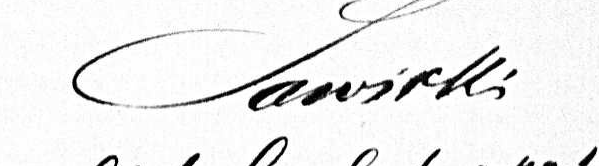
Sawicki
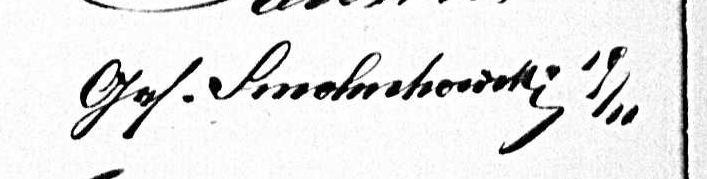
Ges. Smolnchowcki 19/10
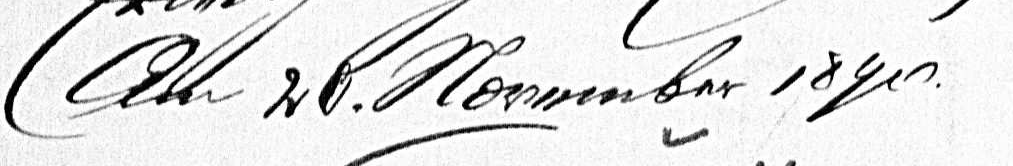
Am 20. November 1890.
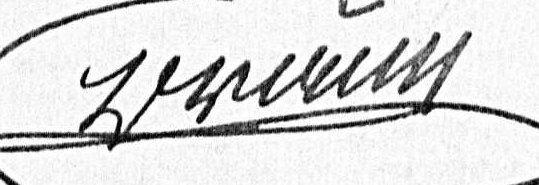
Braun
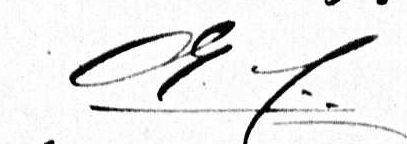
A. E.
